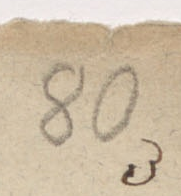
%%
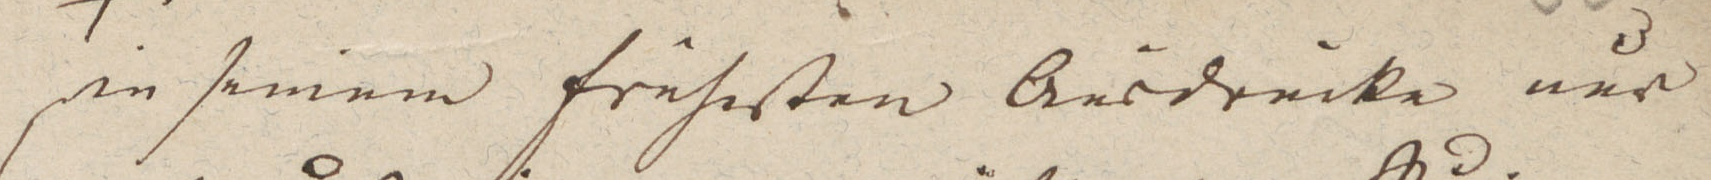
in seinem frühesten Ausdrucke nur
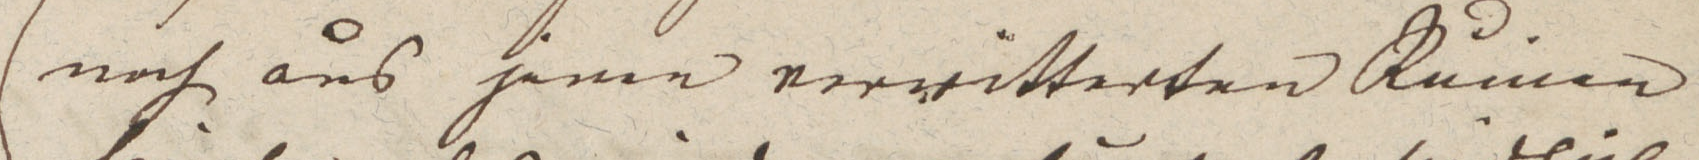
noch aus jenen verwitterten Ruinen
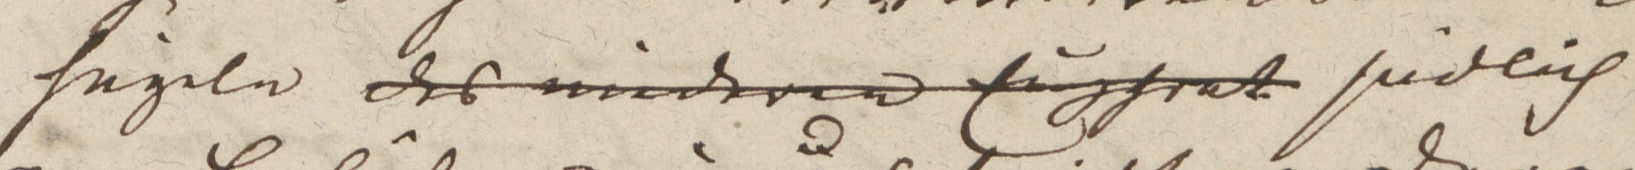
hügeln des niederen Euphrat südlich
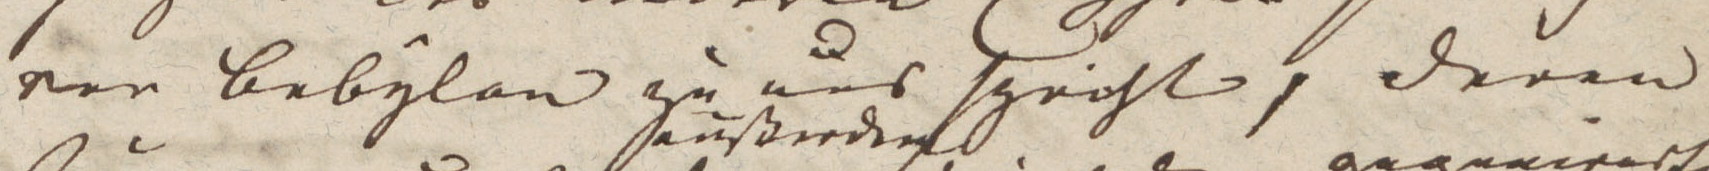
von Babylon zu uns spricht, deren
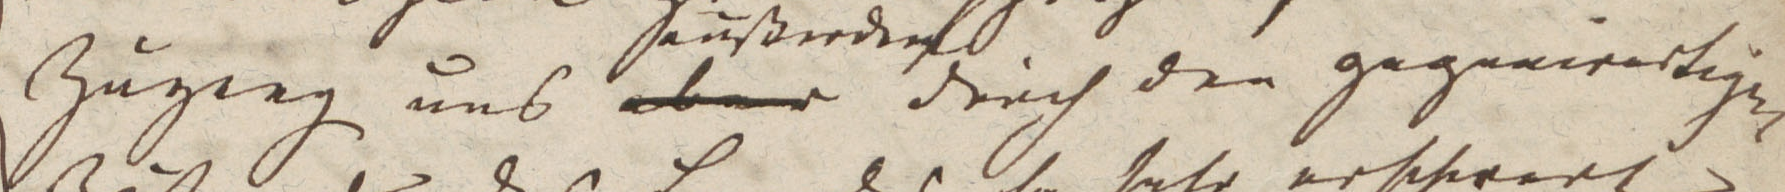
Zugang uns aber ausserdem durch den gegenwärtigen
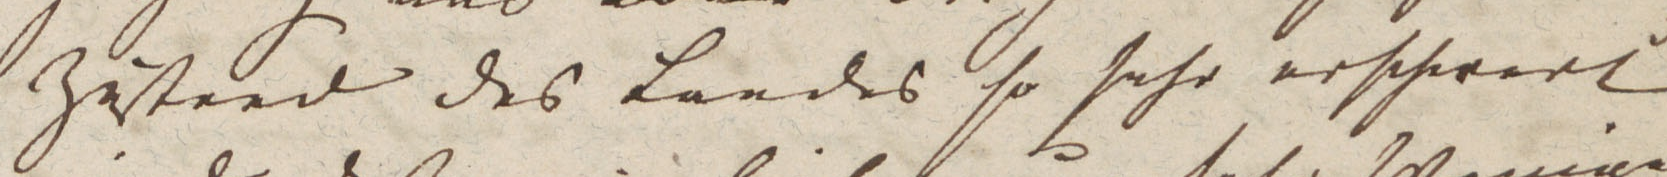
Zustand des Landes so sehr erschwert
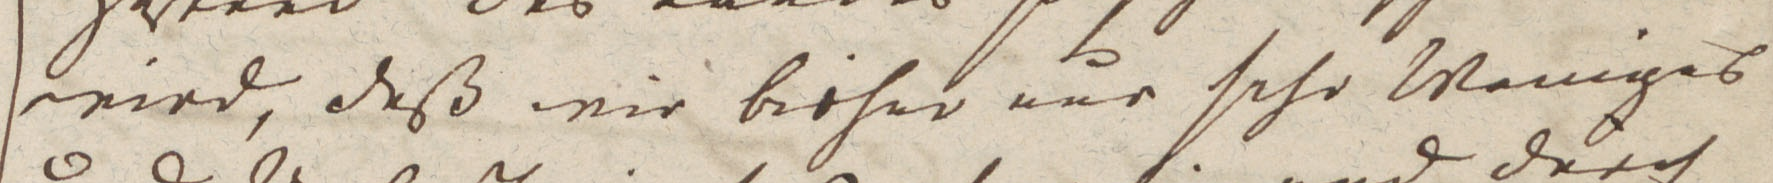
wird, dass wir bisher nur sehr Weniges
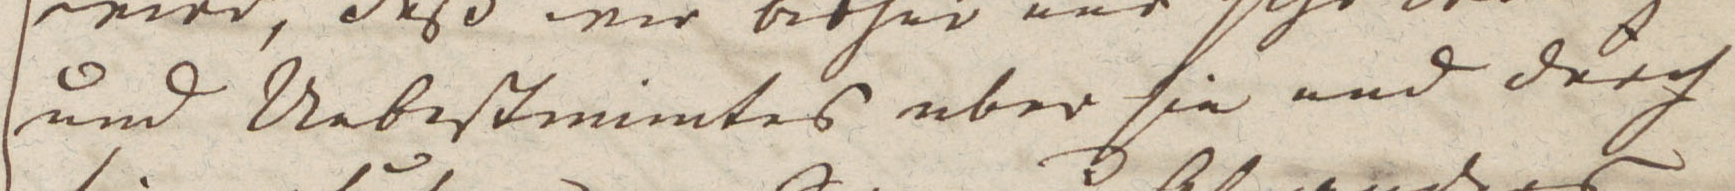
und Unbestimmtes uber sie und durch
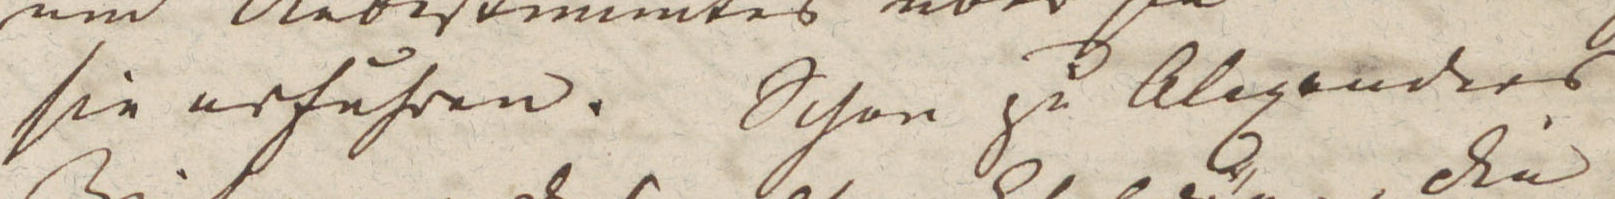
sie erfuhren. Schon zu Alexanders
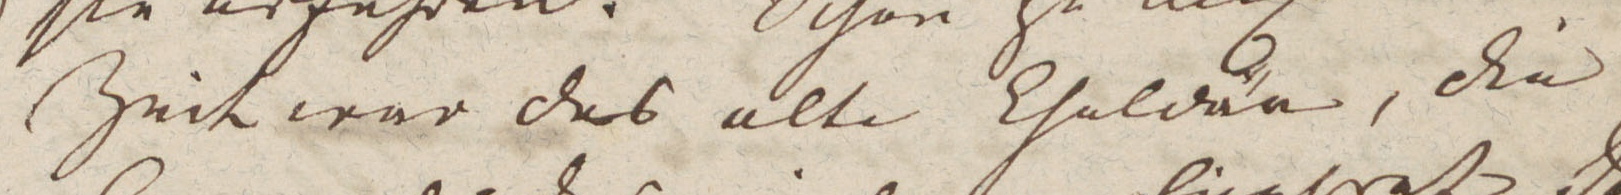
Zeit war das alte Chaldäa, die
